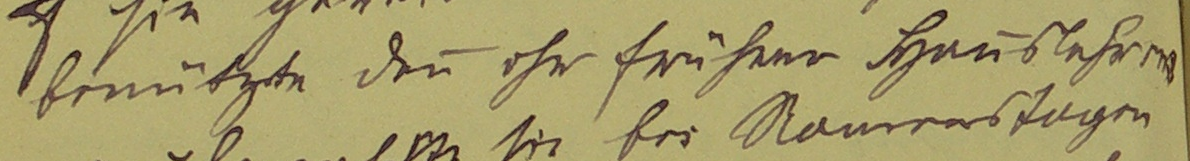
benützte dann ihr früherer Hauslehrer
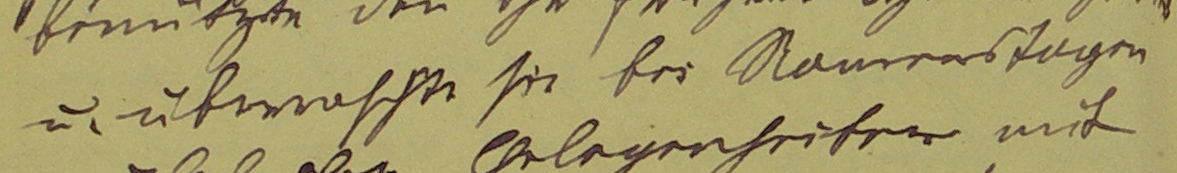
und überraschte sie bei Namenstagen
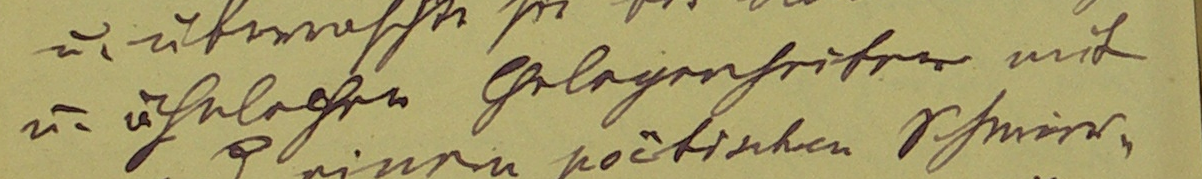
und ähnlichen Gelegenheiten mit
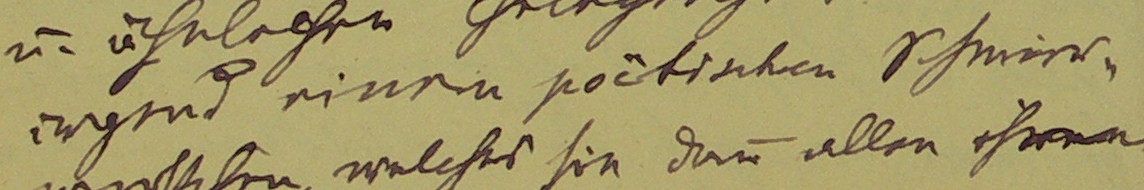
irgend einem poetischen Schmierer¬
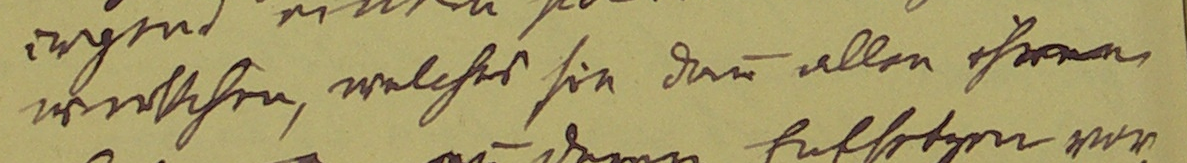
werkchen, welches sie dann allen ihren
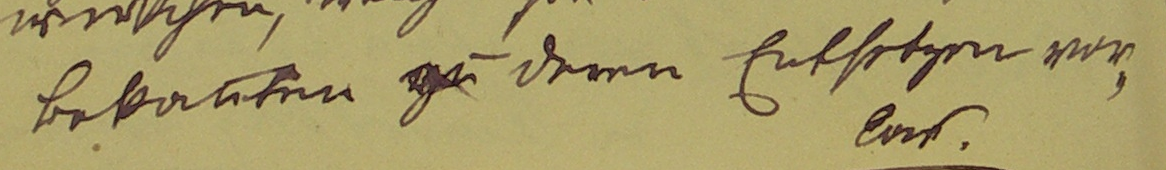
Bekannten zu deren Entsetzen vor¬
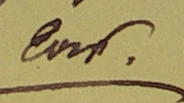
las.
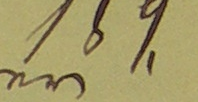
189
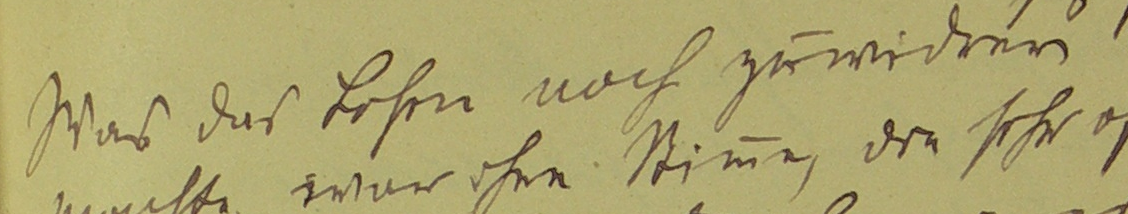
Was das Lesen noch zuwiderer
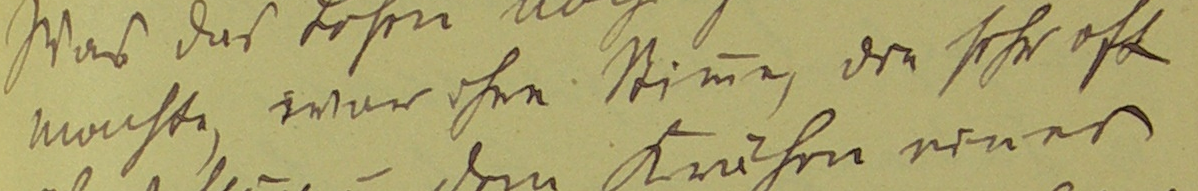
machte, war ihre Stimme, die sehr oft
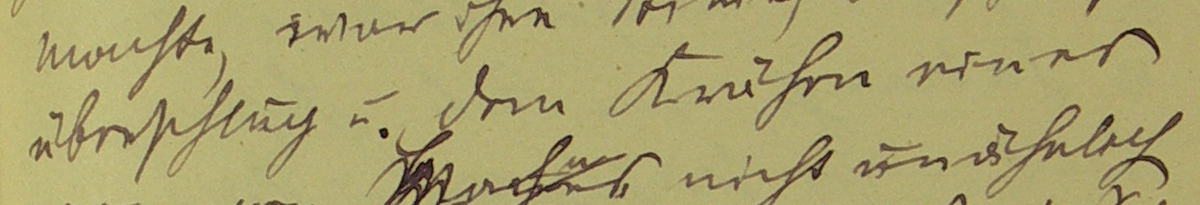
überschlug und dem Krähen eines
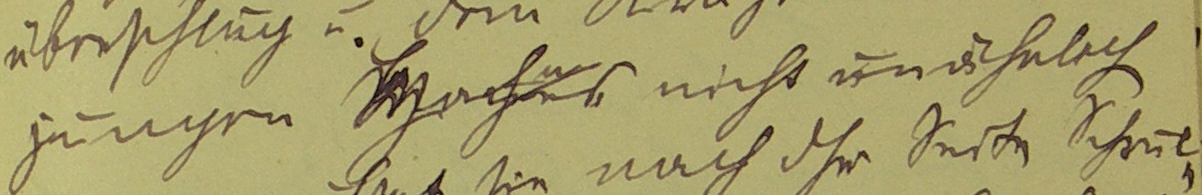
jungen Hahnes nicht unähnlich
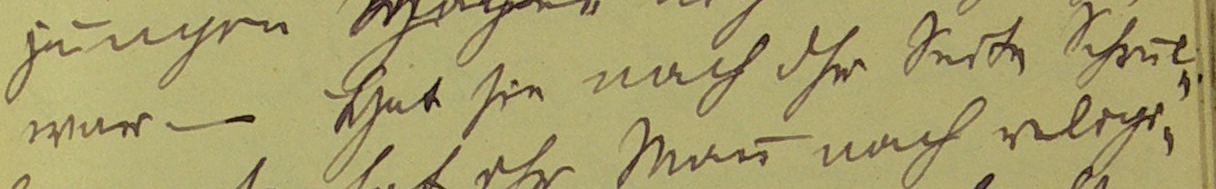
war.- Hat sie noch diese Seite Schrul¬
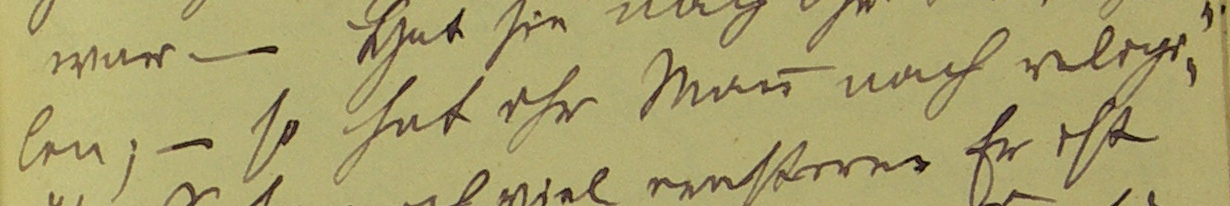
len.- So hat ihr Mann noch welche
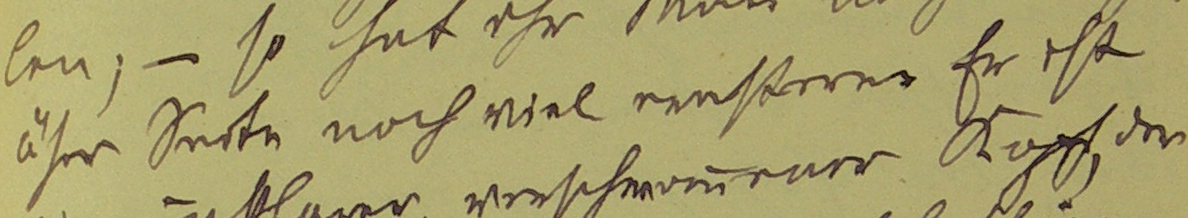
dieser Seiten, noch viel ernstere. Er ist
